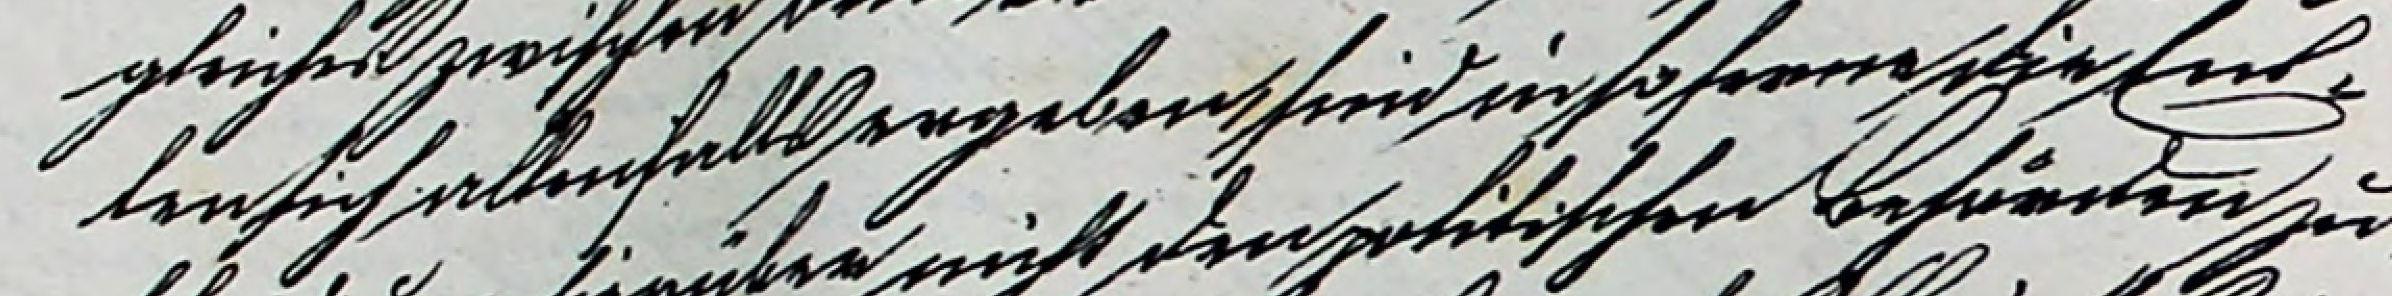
ten sich altenhalts ergeben sind in so ferne die Ent„
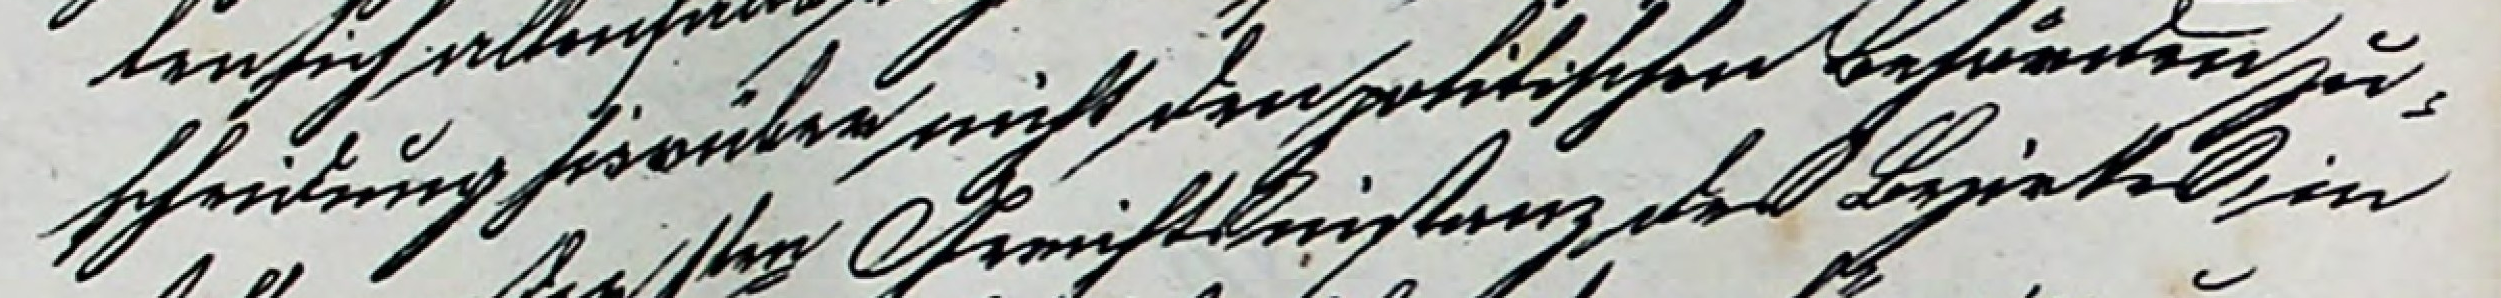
scheidung hierüber nicht den politischen Behörden zu„
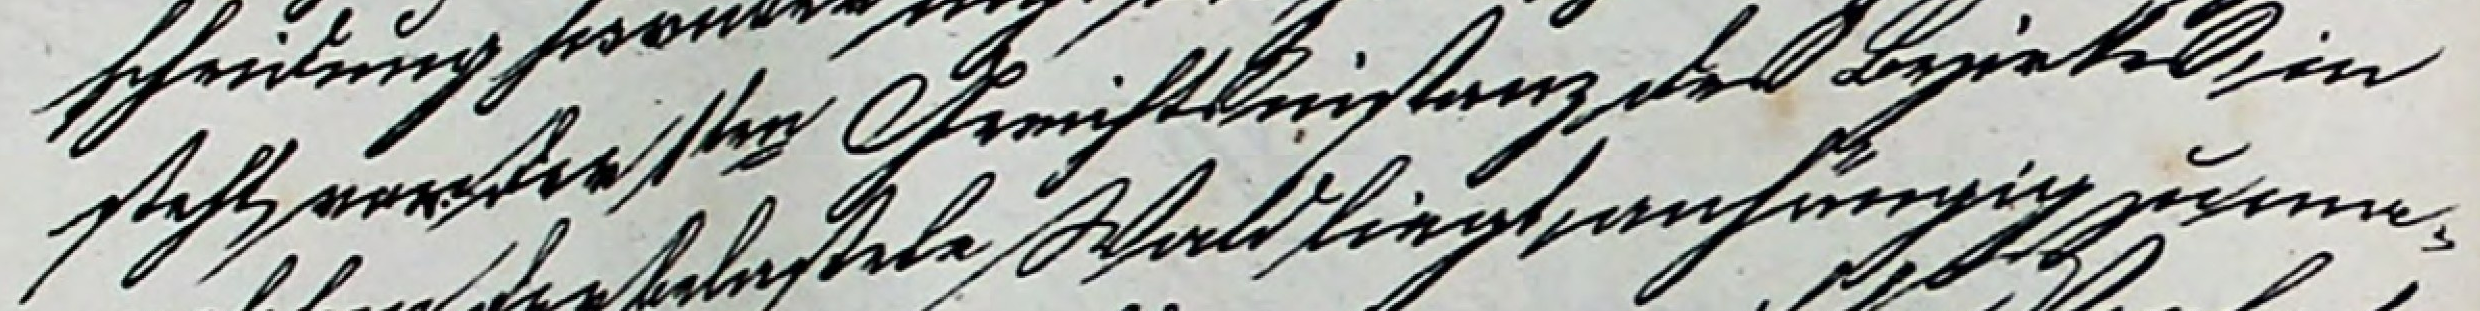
steht, von der 1ten Gerichtsinstanz des Bezirkes, in
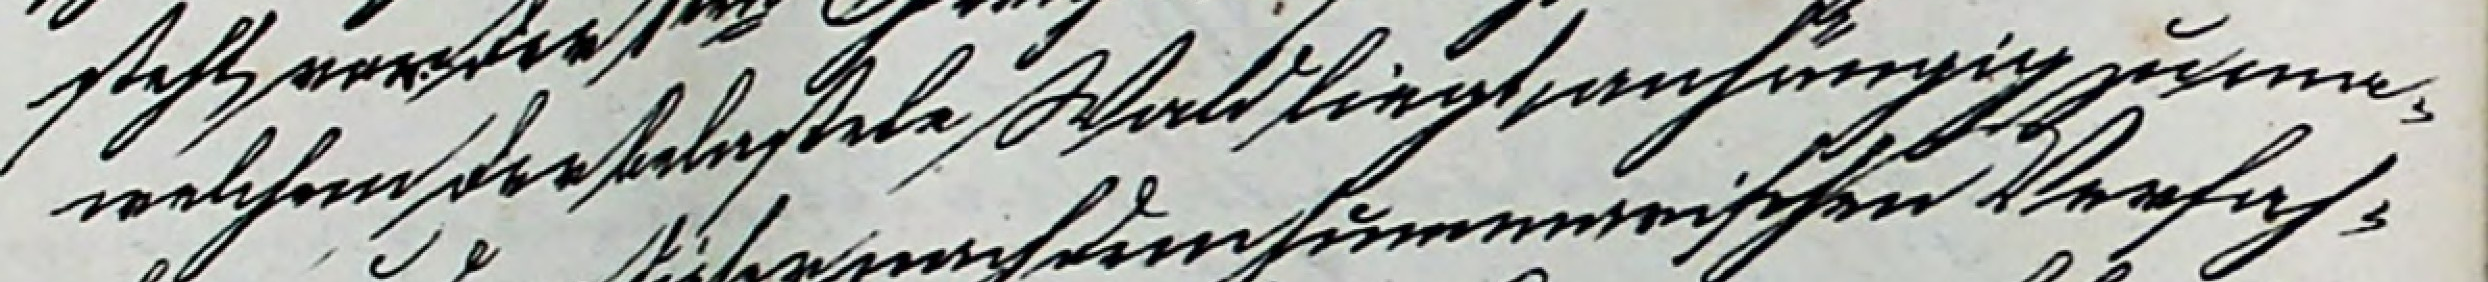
welchem der belastete Wald liegt, anhängig zu ma„
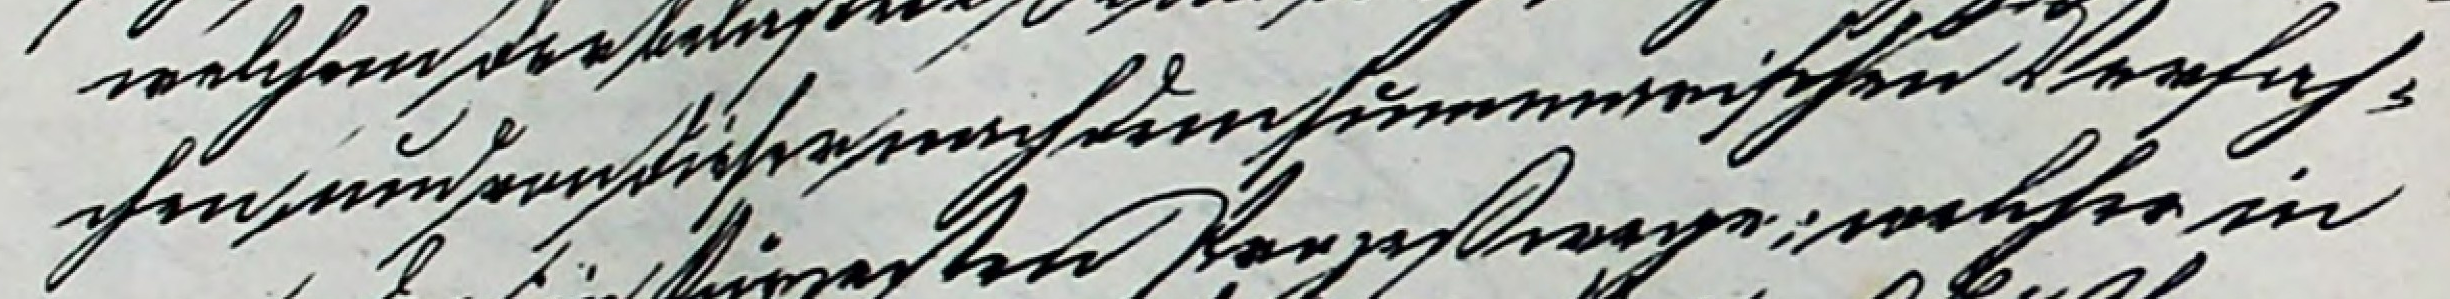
chen und von dieser nach dem summarischen Verfah„
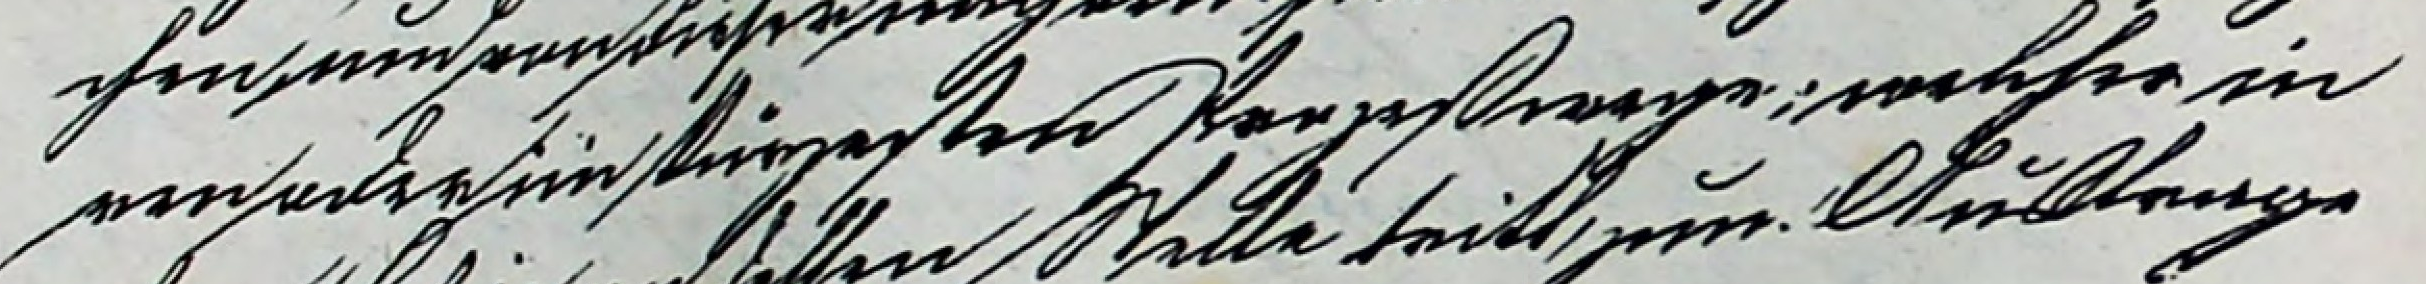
ren oder im kürzesten Perzeßwege; welche in
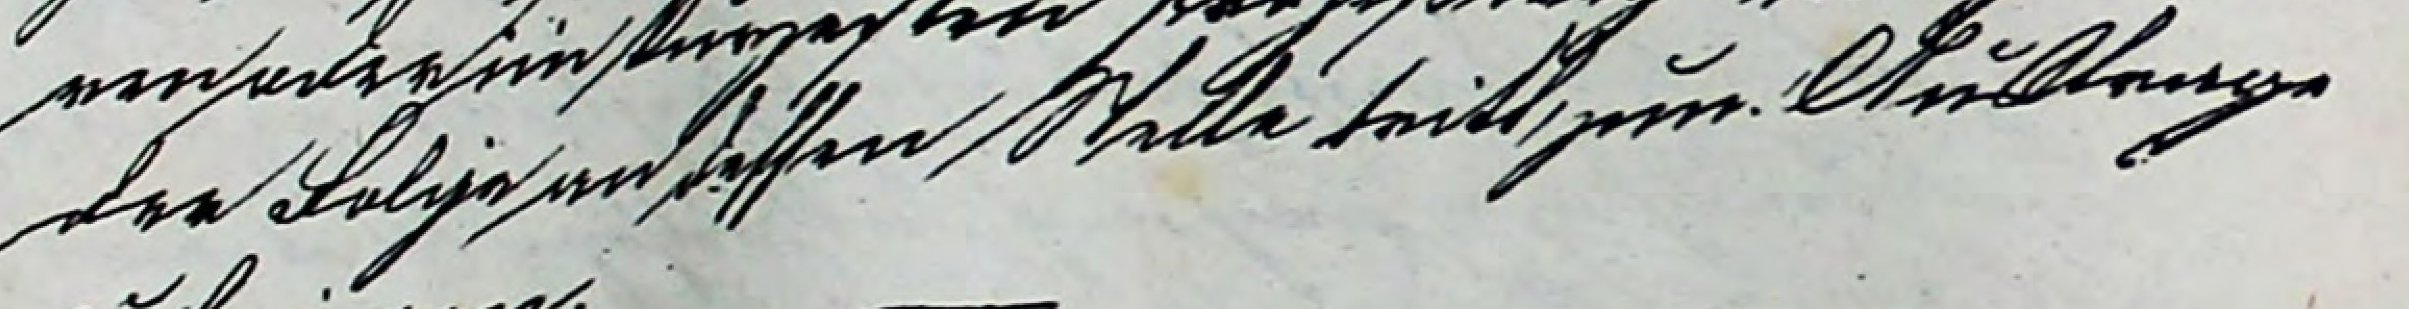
der Folge an dessen Stelle dritt, zun. Austrage
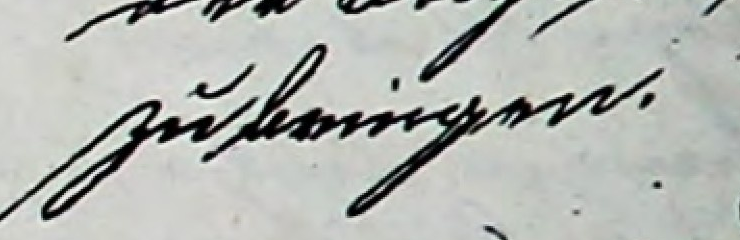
zu bringen.
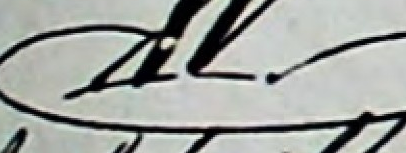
XV.
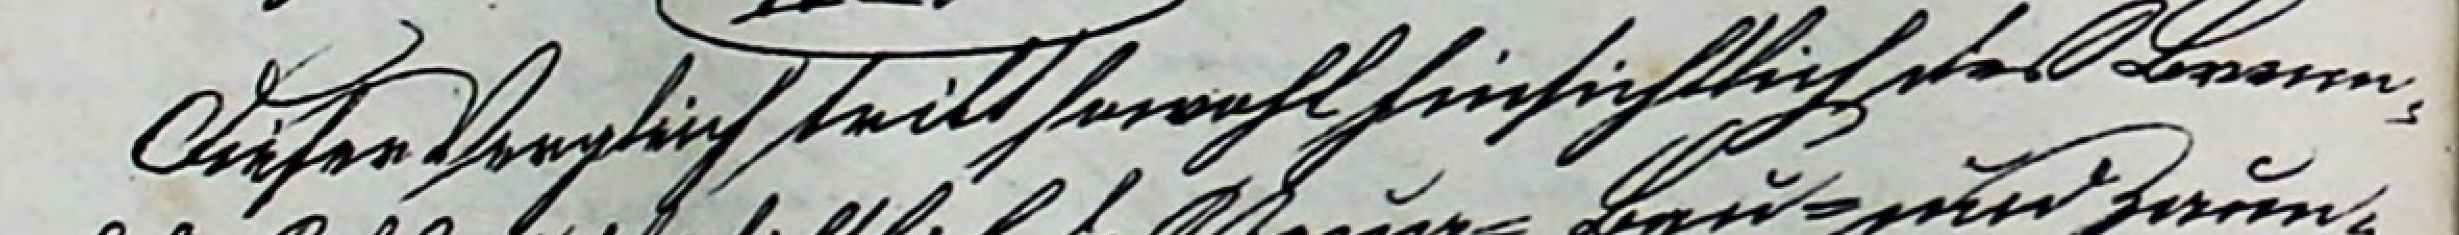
Dieser Vergleich dritt sowohl hinsichtlich des Brenn„
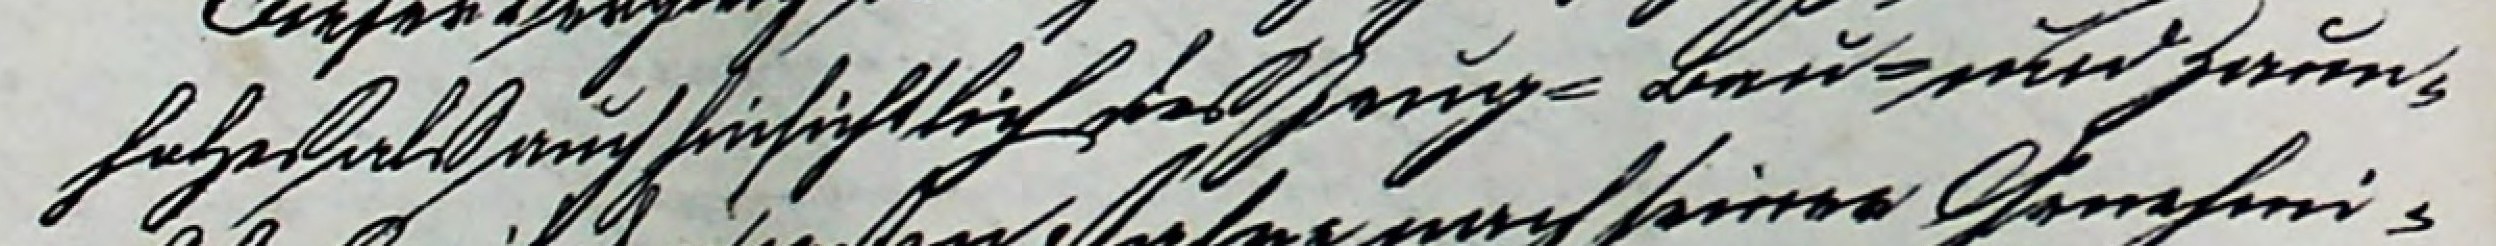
holzes als auch hinsichtlich des Zeug= Bau= und Zaun„
